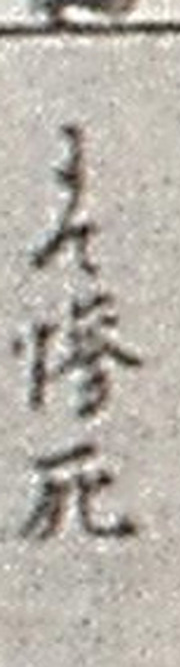にて惨死
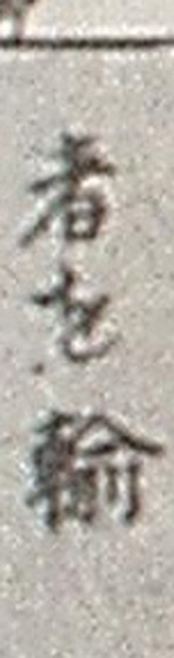者を輸
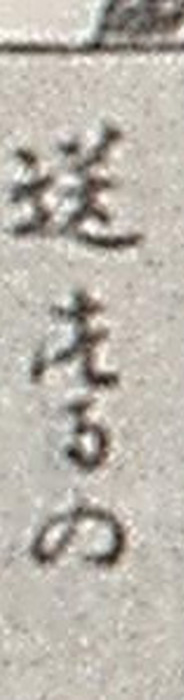送するの

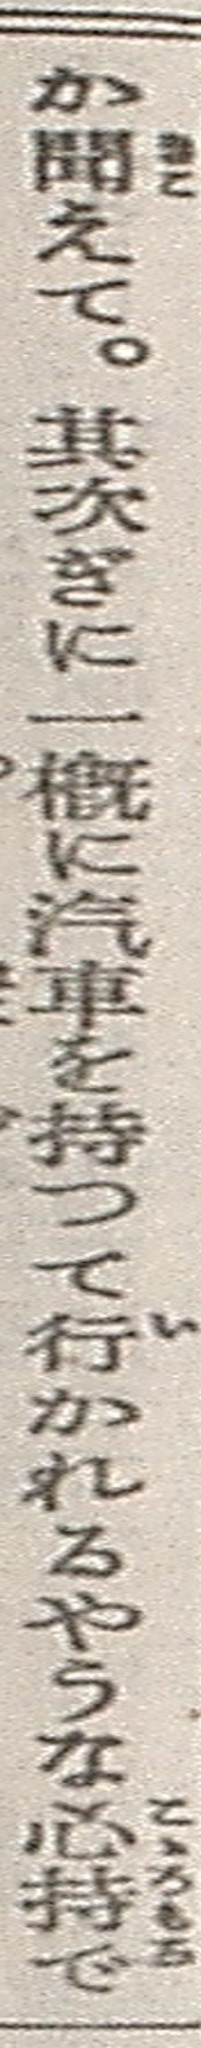か聞えて。其次ぎに一概に汽車を持つて行かれるやうな心持で
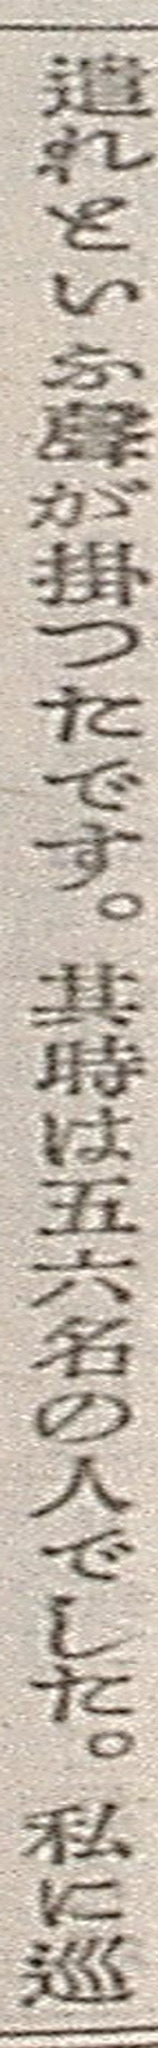遣れといふ声が掛つたです。其時は五六名の人でした。私に巡
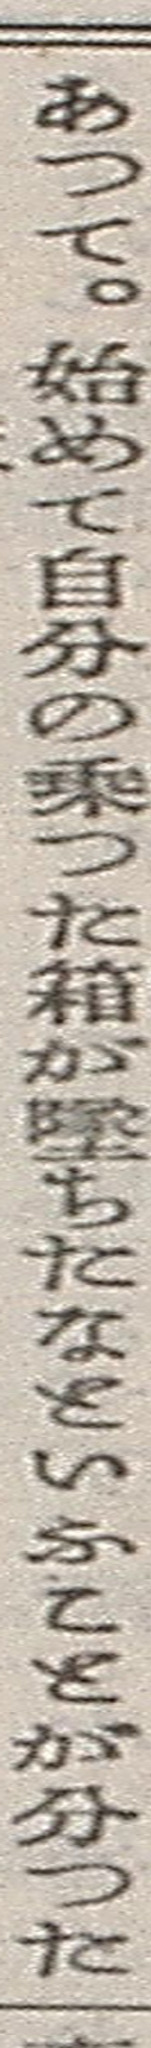あつて。始めて自分の乗つた箱が堕ちたなといふことが分つた
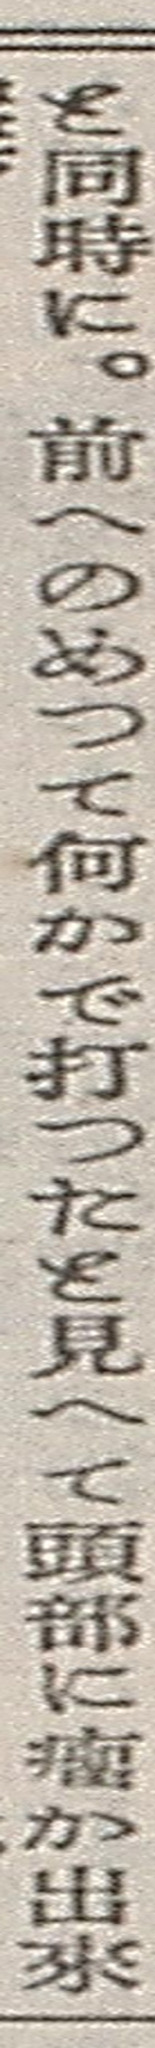と同時に。前へのめつて何かで打つたと見へて頭部に瘤か出来
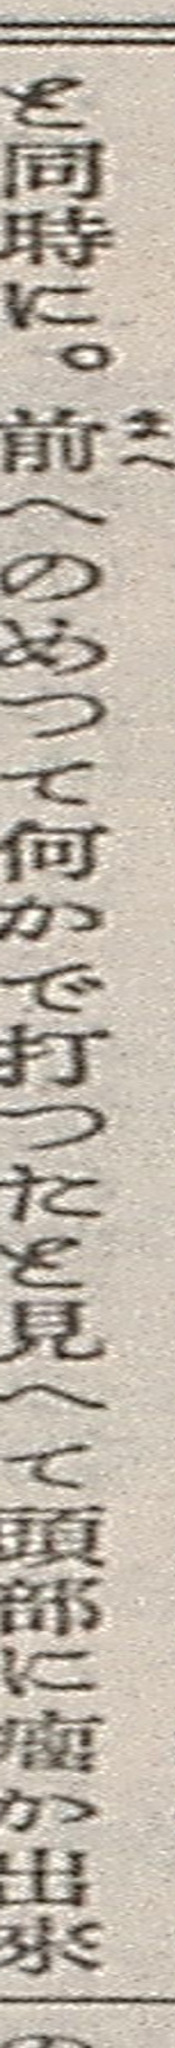と同時に。前へのめつて何かで打つたと見へて頭部に瘤か出来
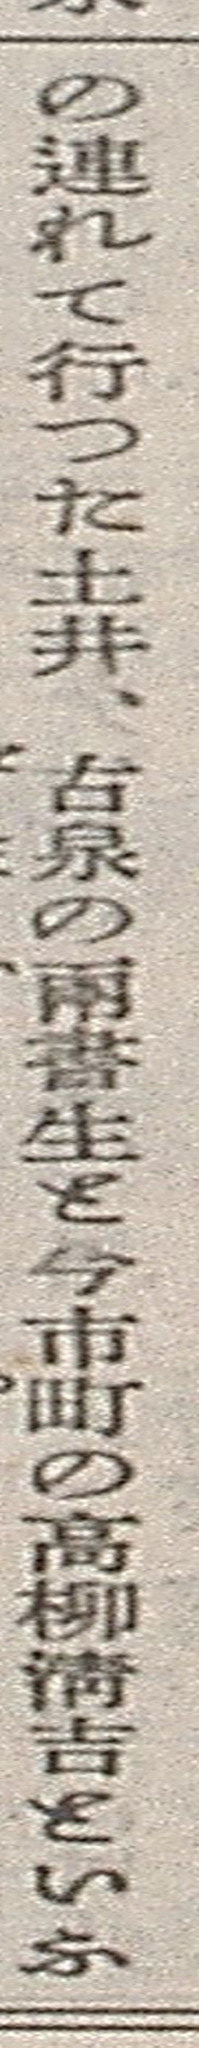の連れて行つた土井、古泉の両書生と今市町の高柳清吉といふ
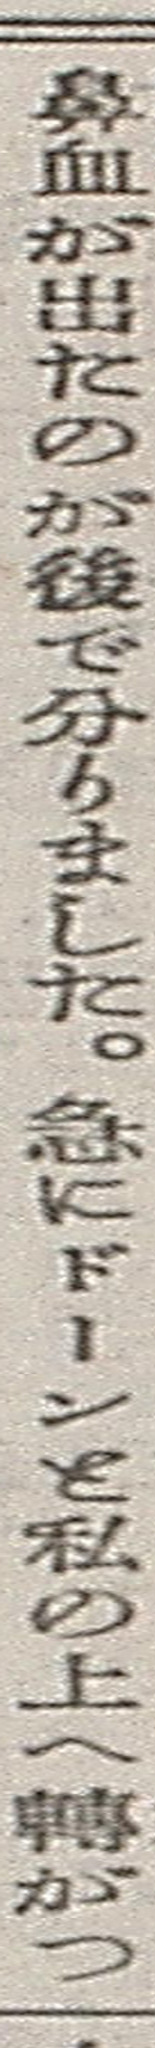鼻血が出たのが後で分りました。急にドーンと私の上へ転がつ
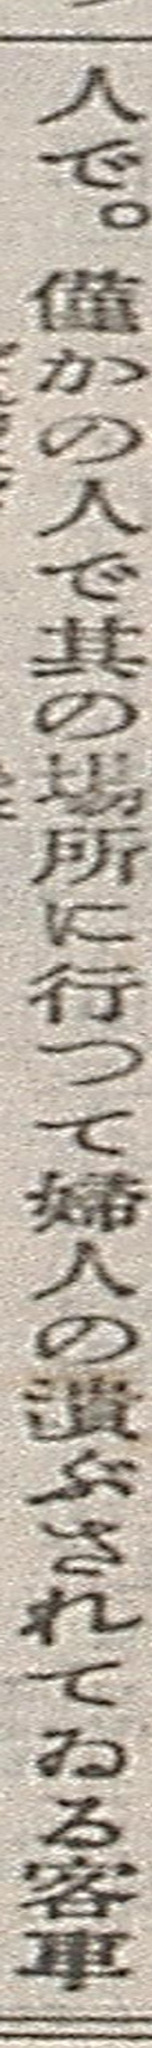人で。僅かの人で其の場所に行つて婦人の潰ぶされてゐる客車
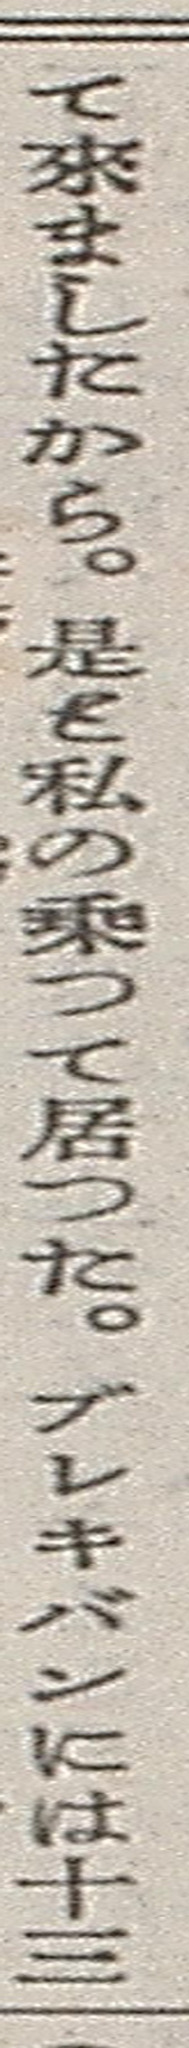て来ましたから。是と私の乗つて居つた。ブレキバンには十三
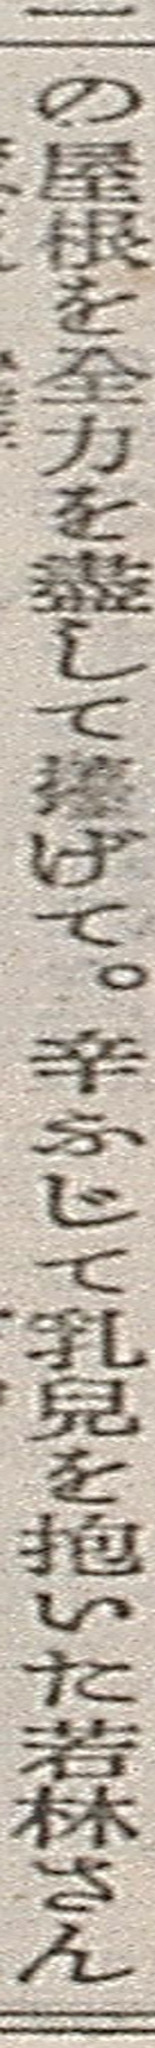の屋根を全力を尽して擡げて。辛ふじて乳児を抱いた若林さん
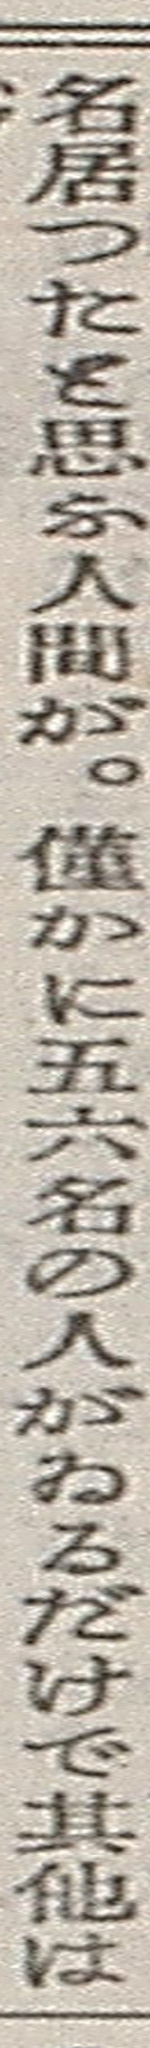名居つたと思ふ人間が。僅かに五六名の人がゐるだけで其他は
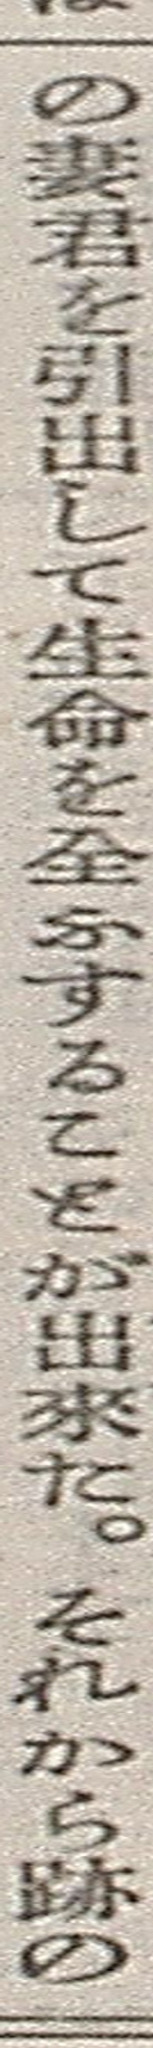の妻君を引出して生命を全ふすることが出来た。それから跡の
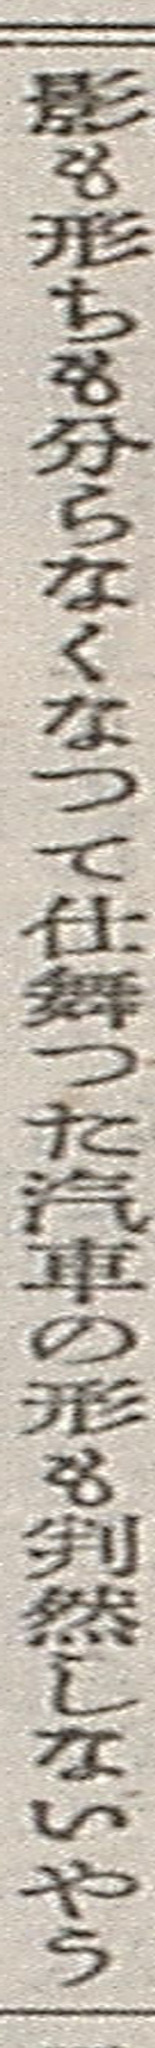影も形ちも分らなくなつて仕舞つた汽車の形も判然しないやう
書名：風俗畫報臨時増刊第百九十九號　明治三十二年十月各地災害圖會（前編之續）
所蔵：東京大学地震研究所図書室 Earthquake Research Institute Library, The University of Tokyo, JAPAN
